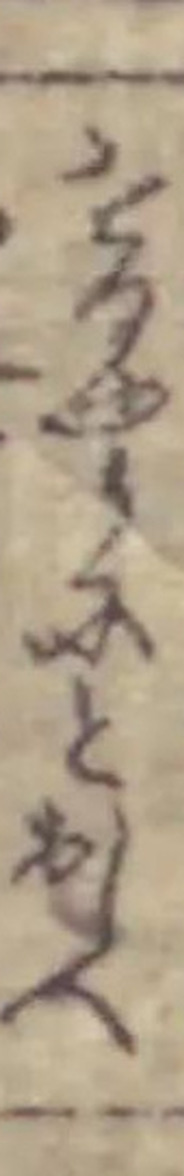するやうにとおしへ
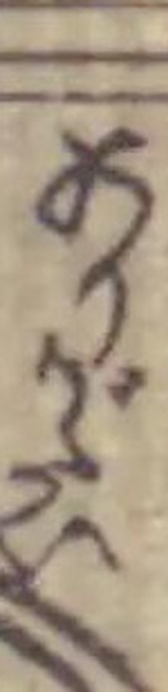ありがたい
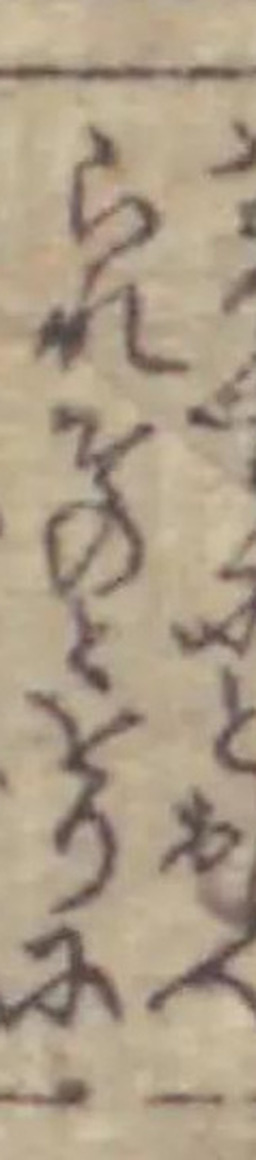られそのとをりに
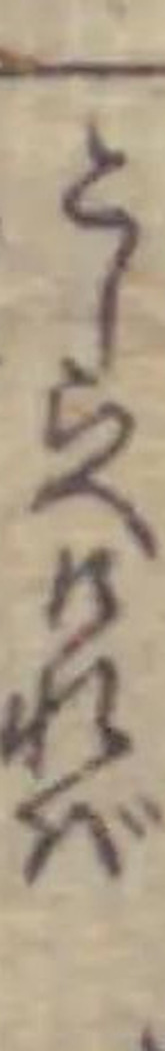こしらへければ
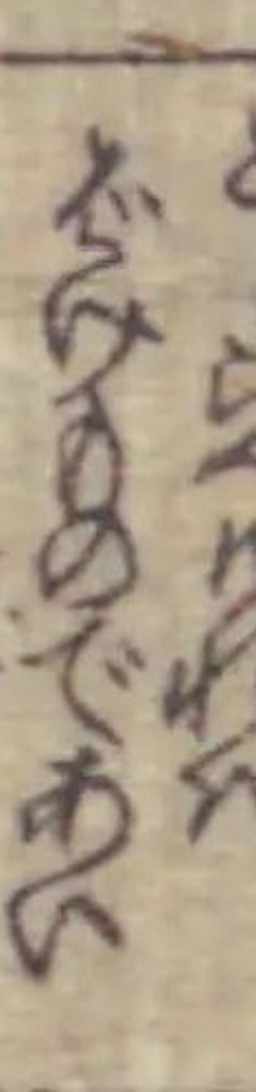ばけものであい
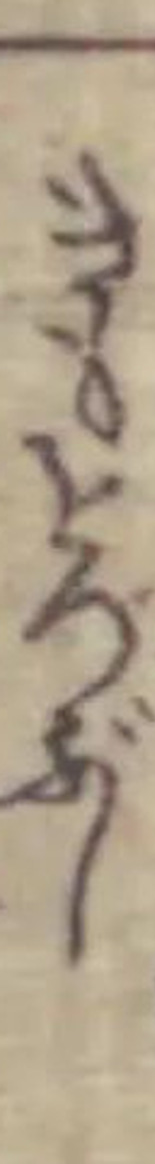きもをつぶし
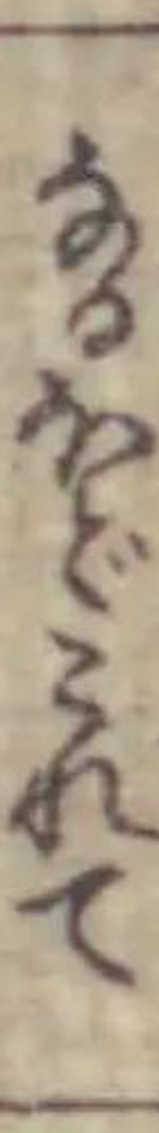なるほどこれて
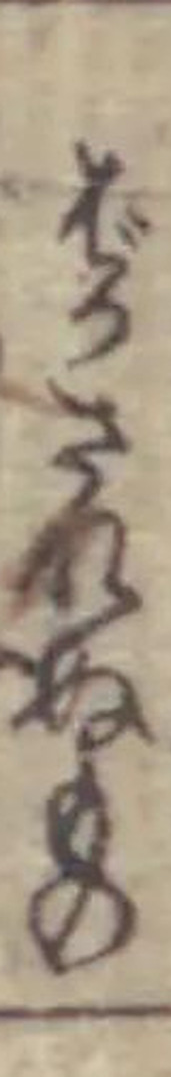ばかされぬもの
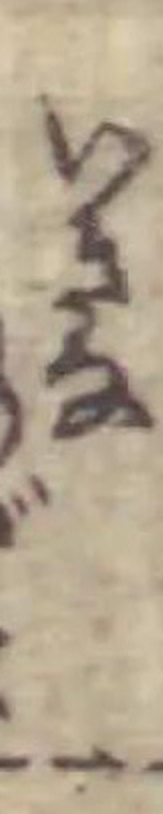いきな
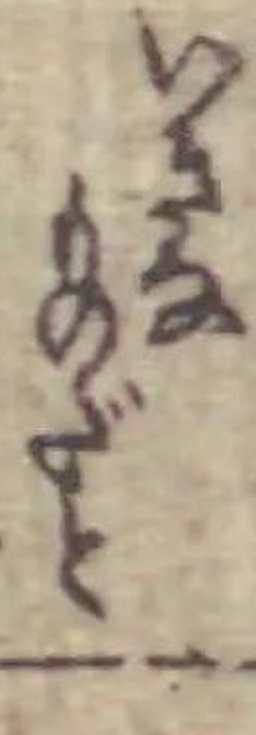ものだと
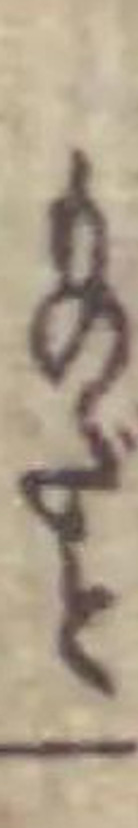ものだと
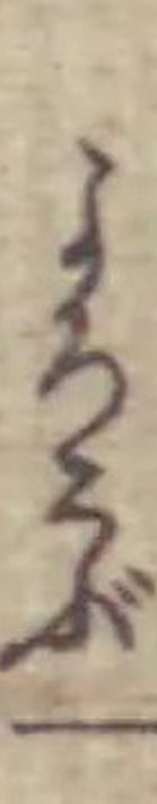よろこぶ
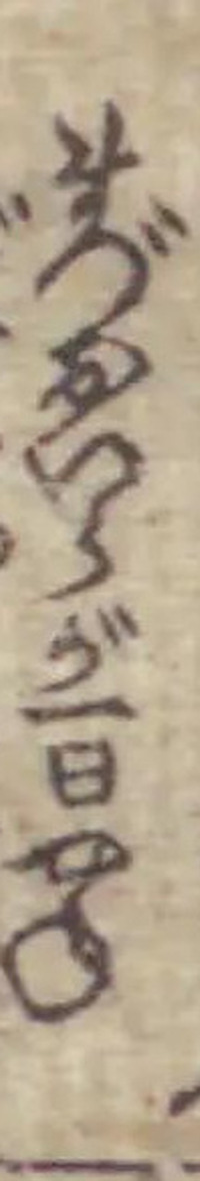まづおいらが一日やね
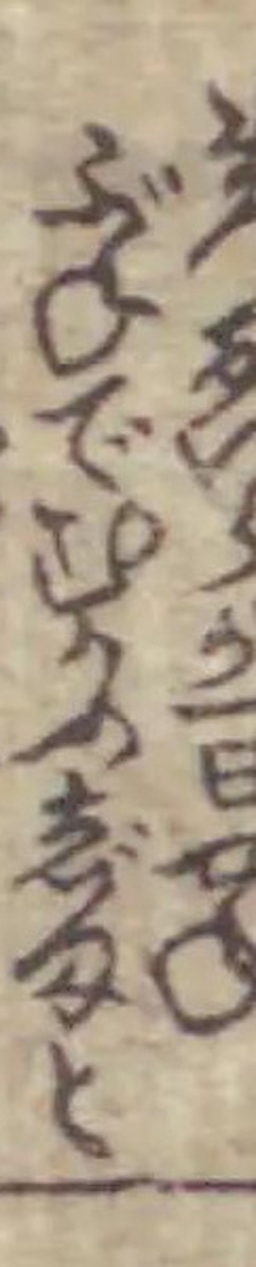ぶねでむかうじまと
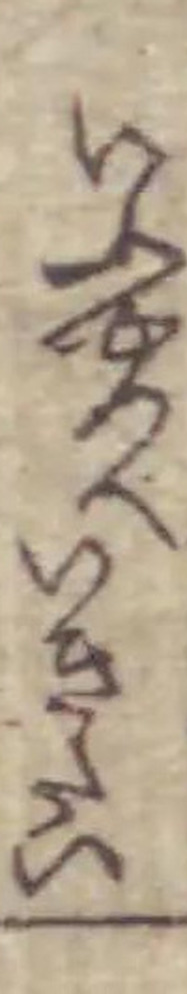いふやつへいきたい

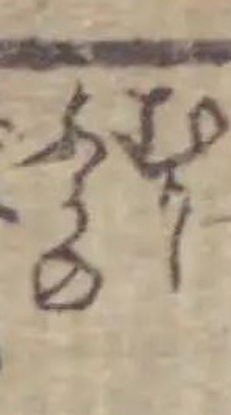ふうの
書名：化物昼寝鼾 2巻
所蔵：国立国会図書館 National Diet Library, JAPAN
